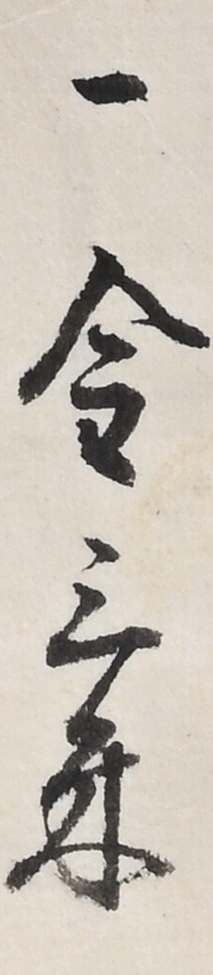一金三朱折蔵
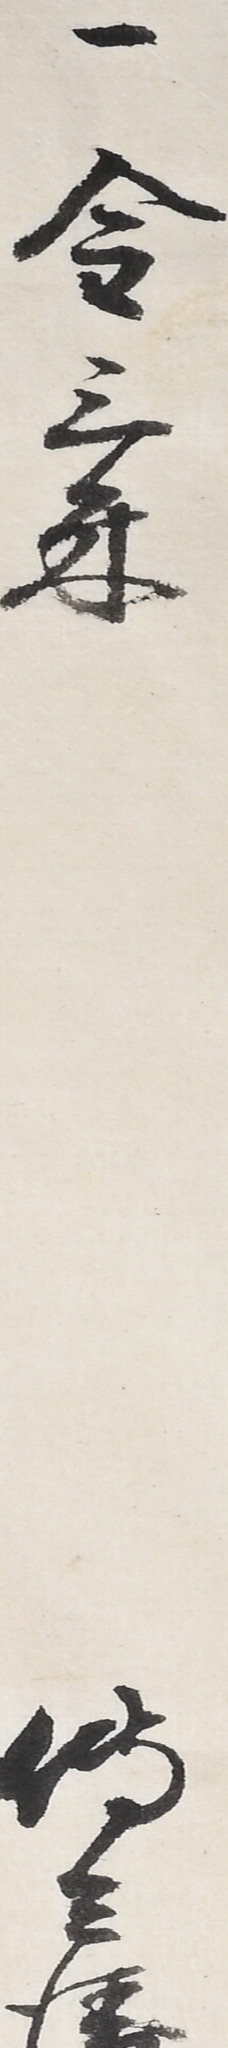一金三朱伝兵衛
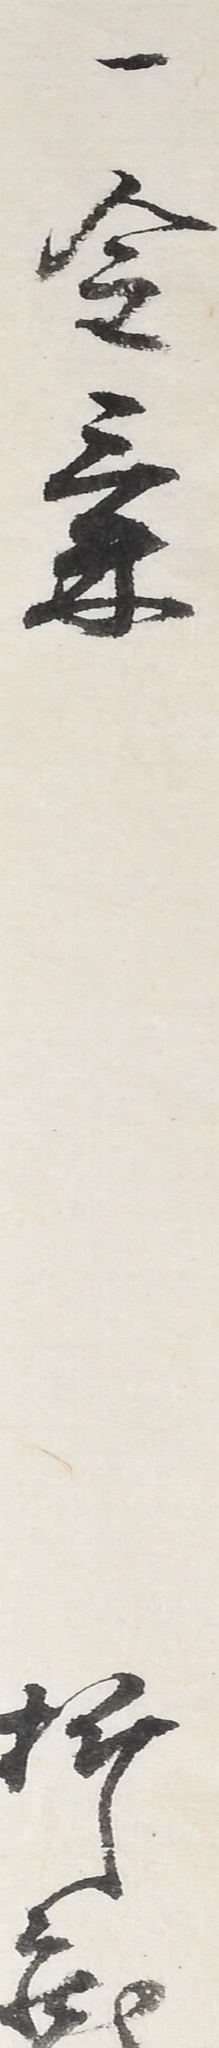一金三朱折蔵
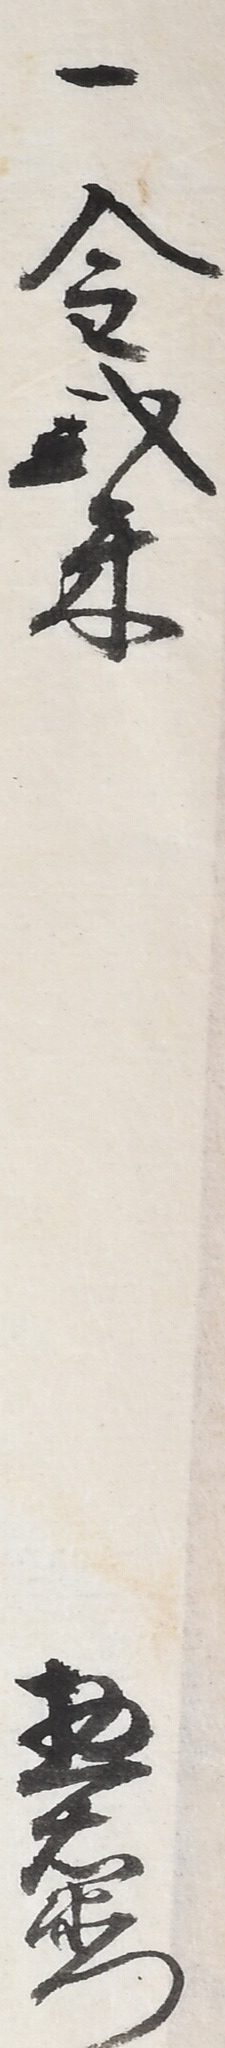一金弐朱惣右衛門
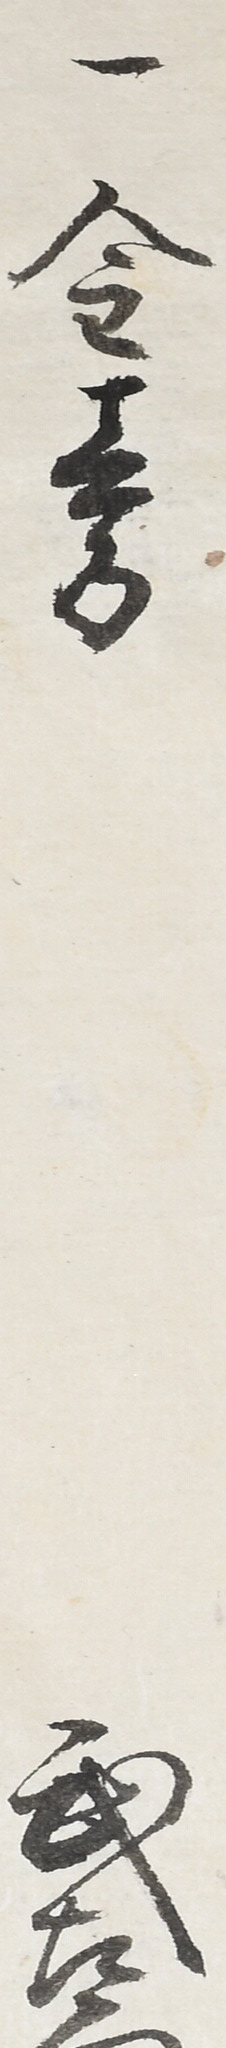一金壱分武左衛門
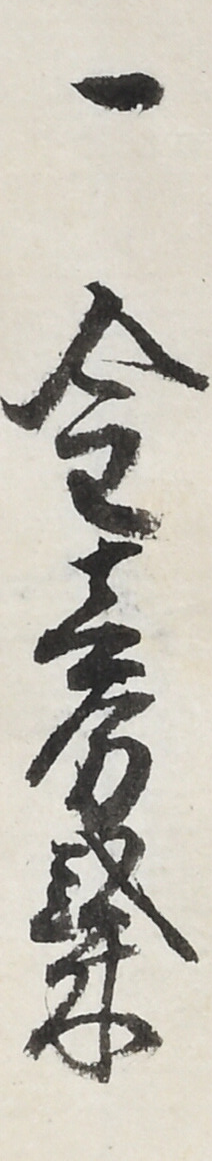一金壱分弐朱平吉
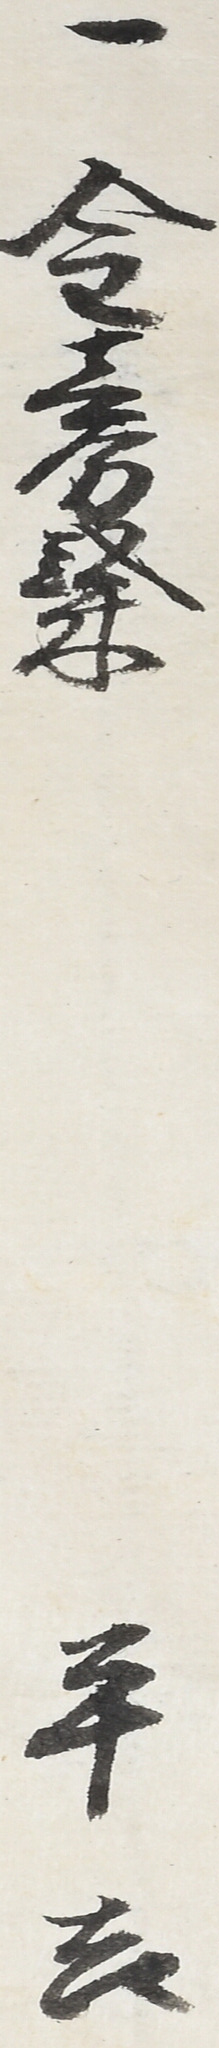一金壱分弐朱平吉

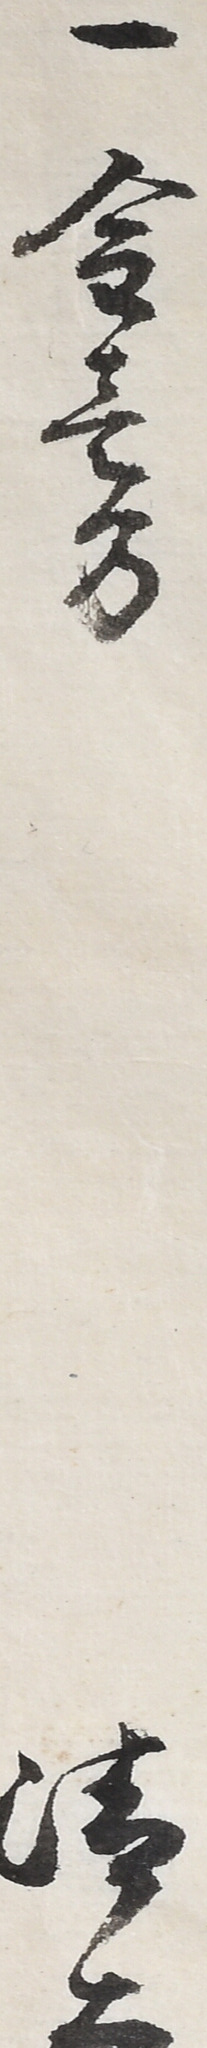一金壱分要右衛門
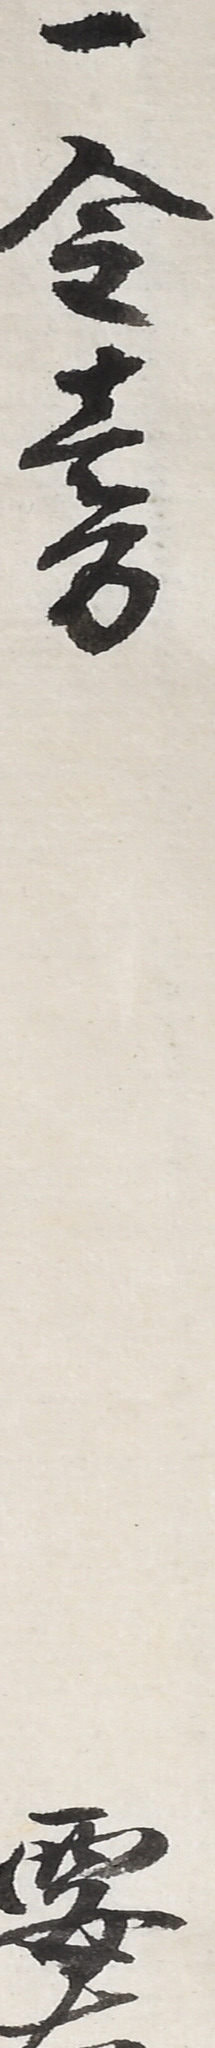一金壱分清太
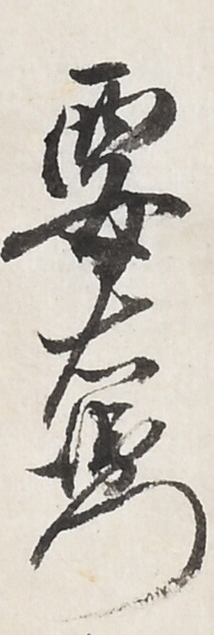茂右衛門
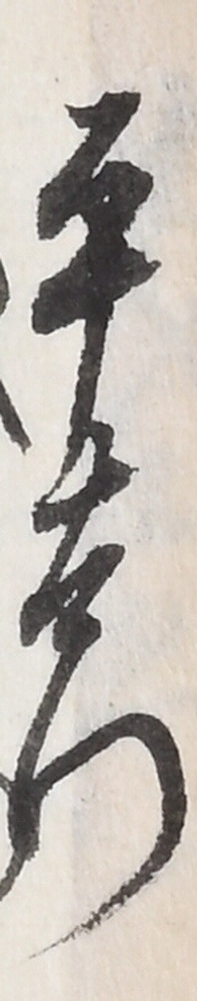茂右衛門
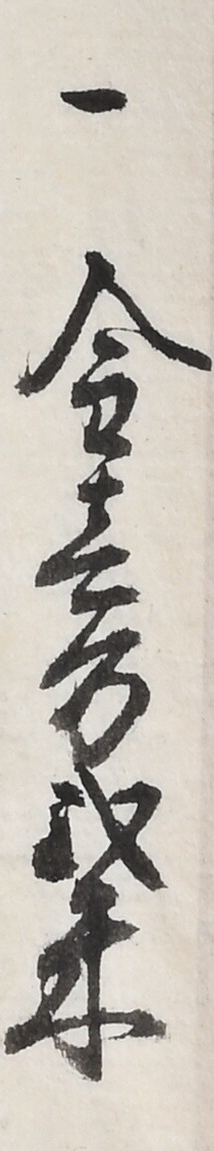一金壱分清太
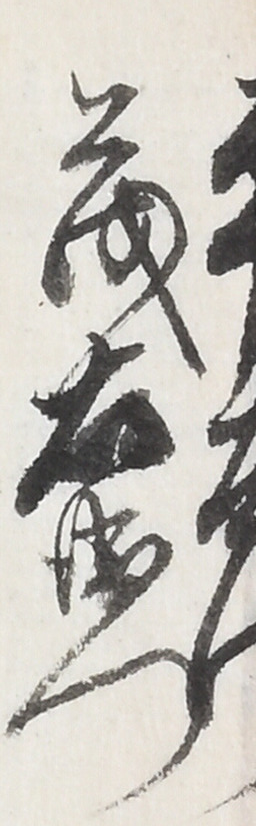茂右衛門
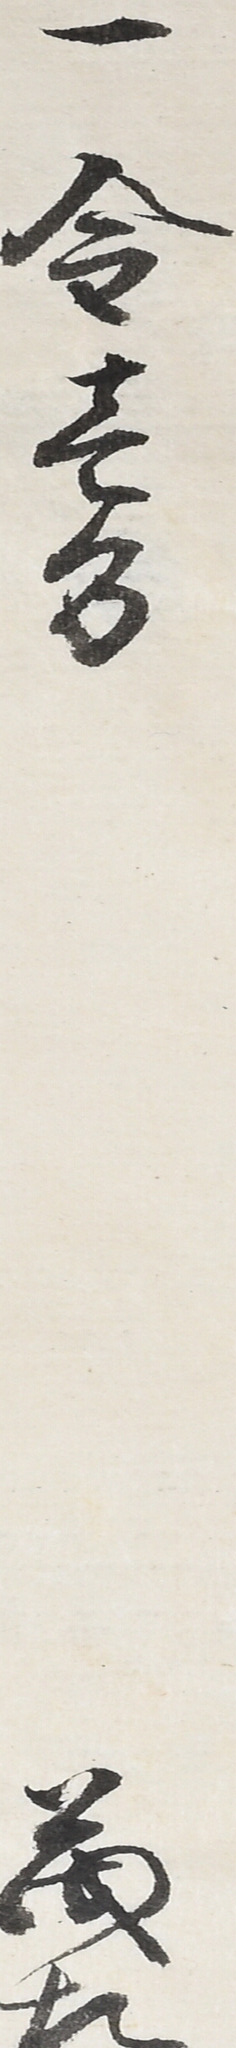一金壱分清太
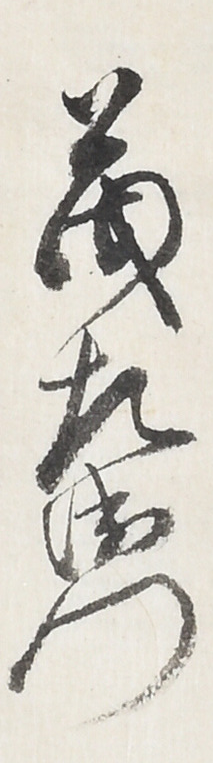茂右衛門
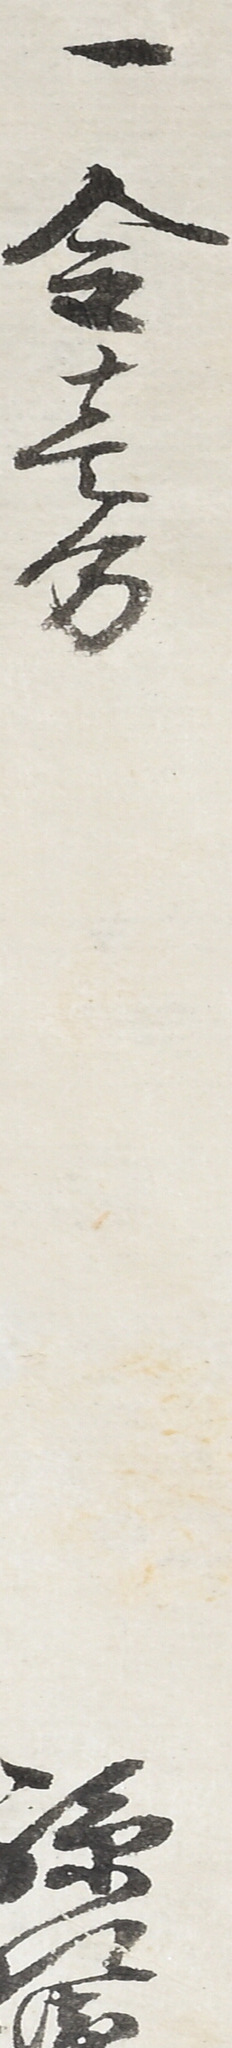一金壱分孫左衛門
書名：御拝地百五拾年御祝儀献上御目録名前
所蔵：伊那市立高遠町図書館・合同会社AMANE
